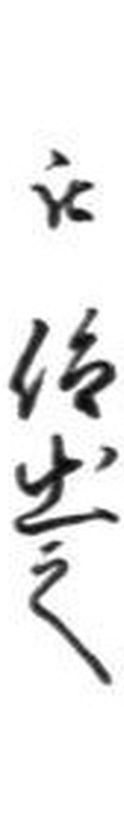被仰出之
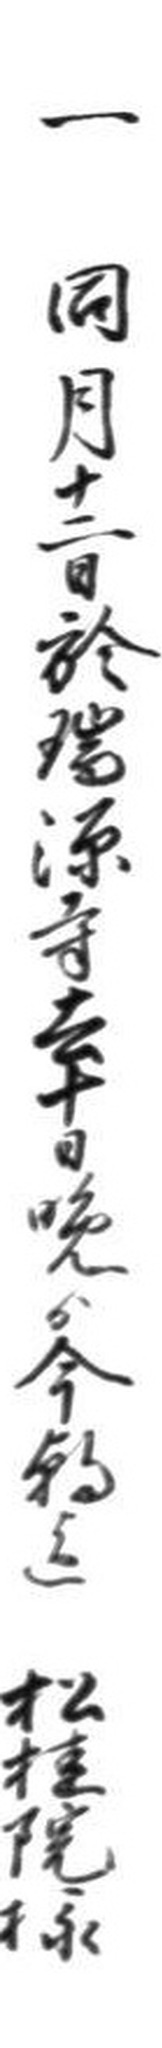一同月十二日於瑞源寺去十日暁ゟ今朝迄松桂院様
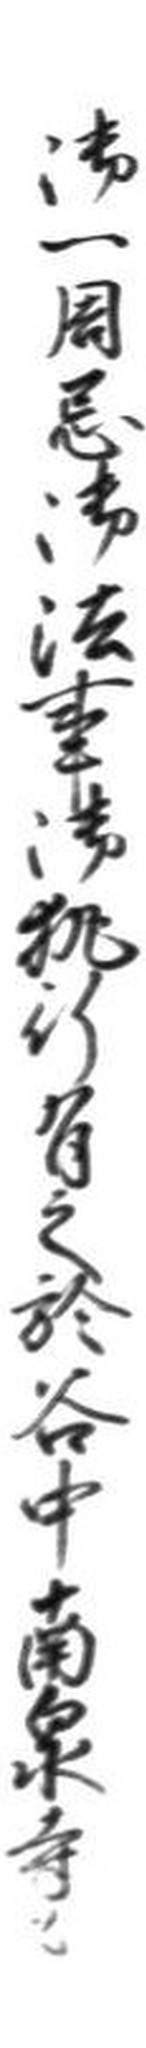御一周忌御法事御執行有之谷中南泉寺も
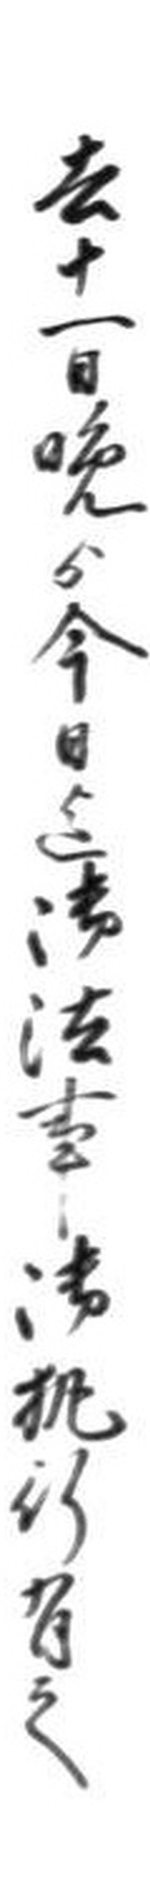去十一日晩ゟ今日迄御法事御執行有之
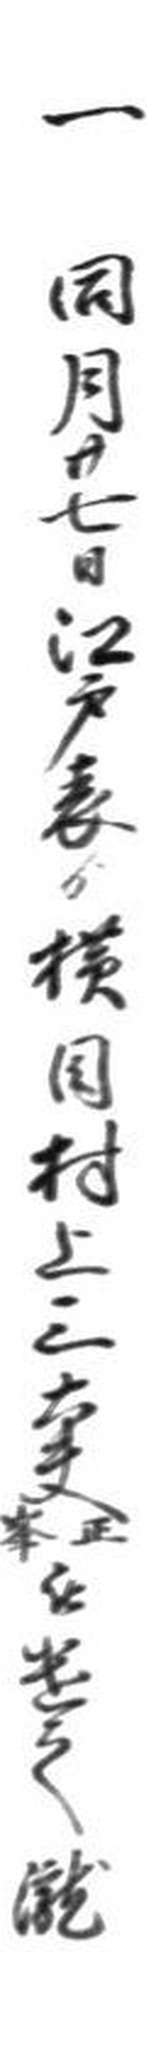一同月廿七日江戸表ゟ横目村上三太夫正峰被遣之瀧
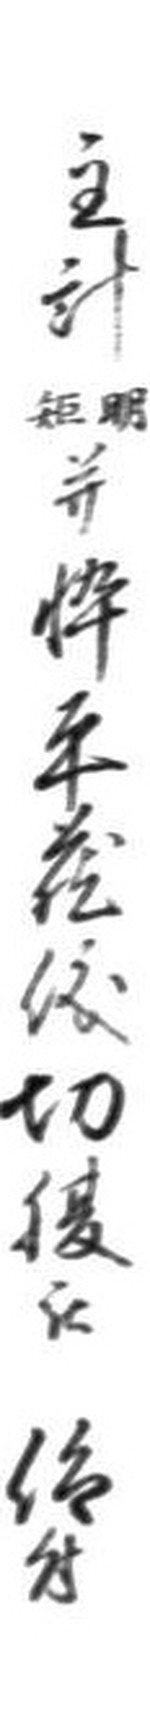主計明矩忰平蔵儀切腹被仰付
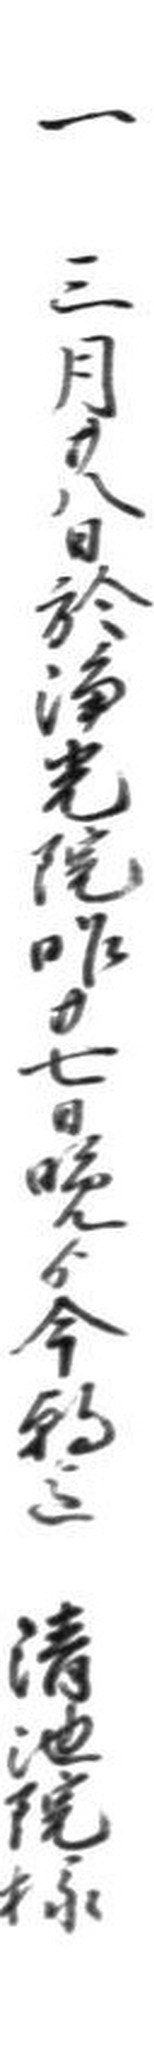一三月廿八日於浄光院昨廿七日晩ゟ今朝迄清池院様
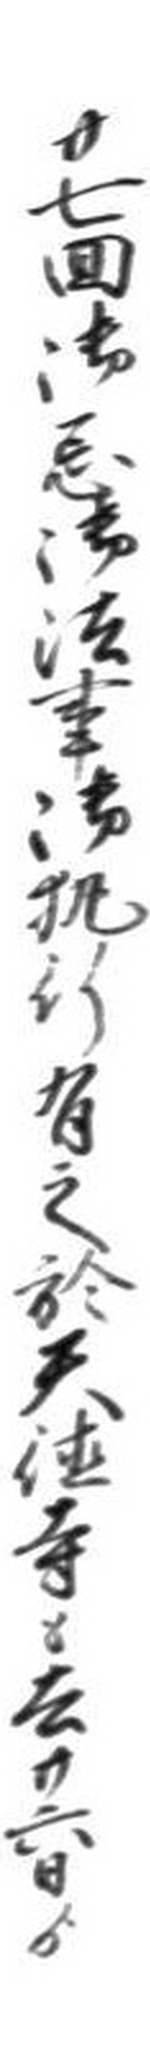廿七回御忌御法事御執行有之於天徳寺も去廿六日ゟ
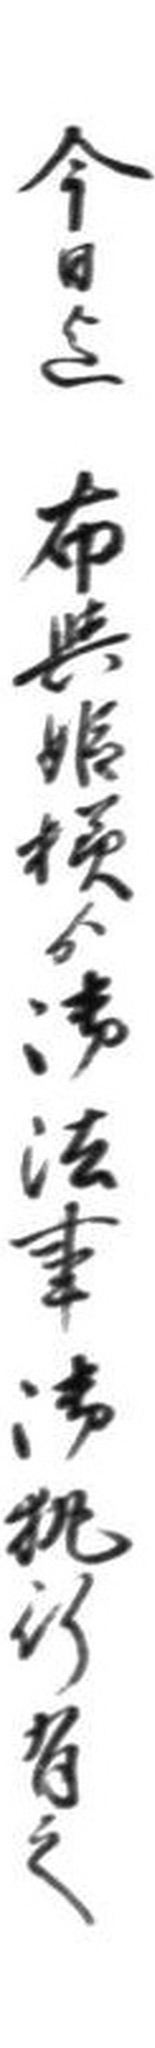今日迄布与姫様ゟ今御法事御執行有之

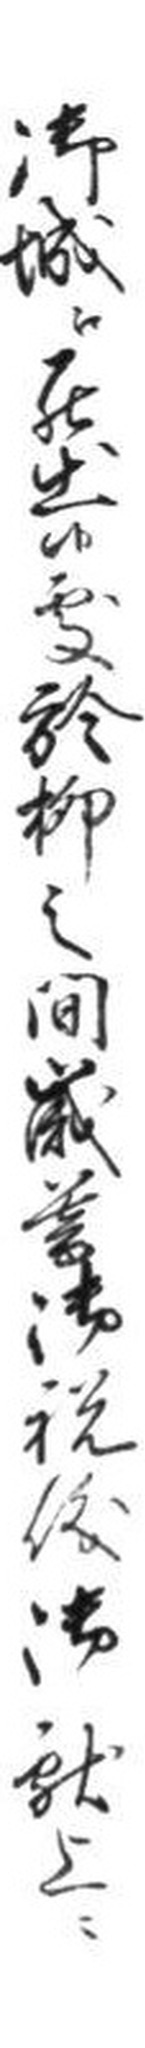御城江罷出候処於柳之間歳暮御祝儀御御献上ニ
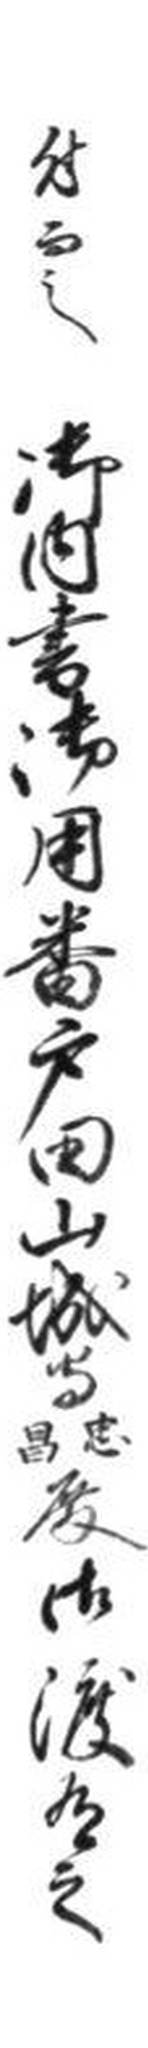付而之御内書御用番戸田山城守忠昌殿御渡有之
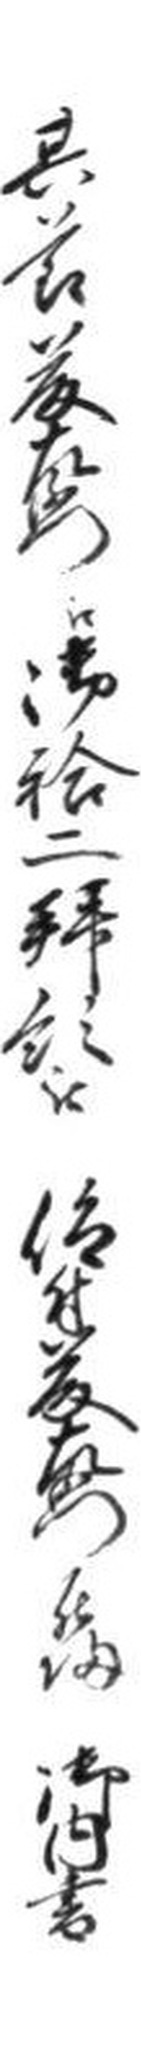其節藤左衛門江御袷御ニ拝領被仰付藤左衛門罷帰御内書
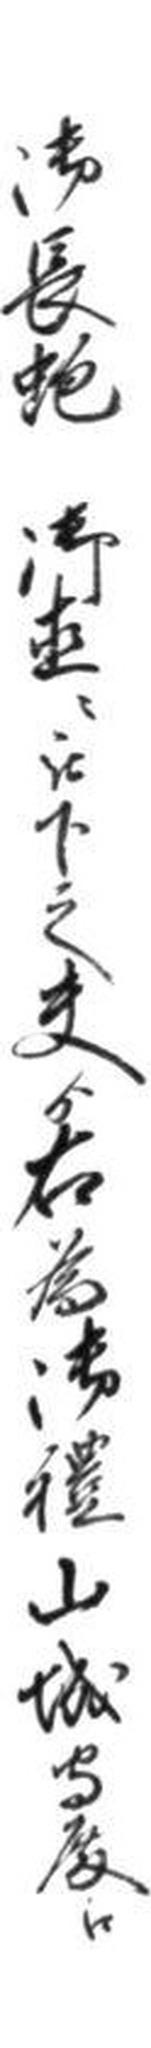御長蚫御直々被下之夫ゟ右為御礼山城守殿江
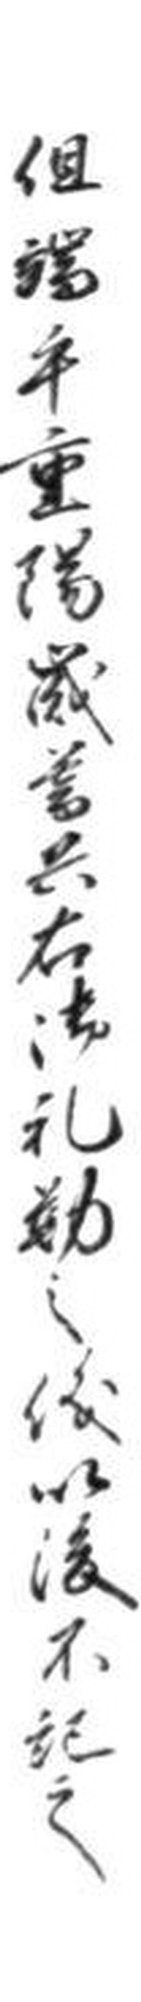但端午重陽歳暮共右御礼勤之儀以後不記之
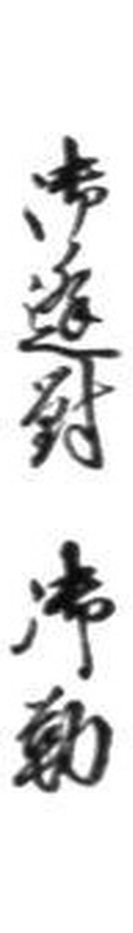御逢対御勤
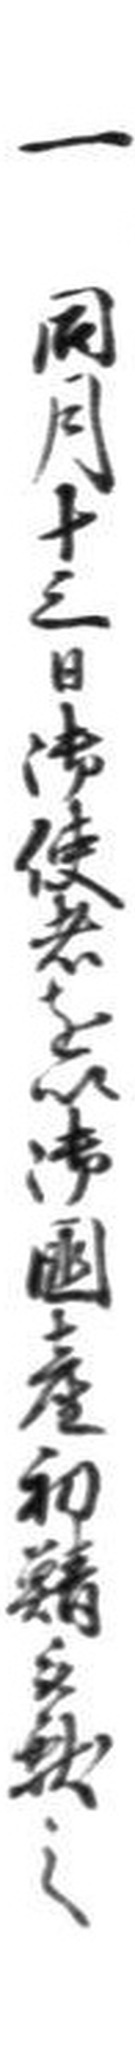一同月十三日御使者を以御国産初鯖被献之
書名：家譜 十六 吉品公 従貞享三年閏三月到同四年
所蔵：福井県文書館 Fukui Prefectural Archives
